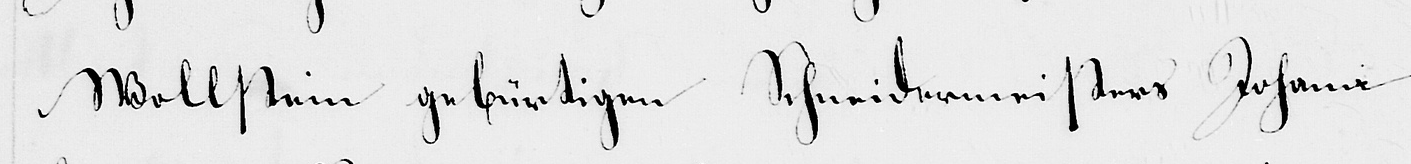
Wollstein gebürtigen Schneidermeisters Johann
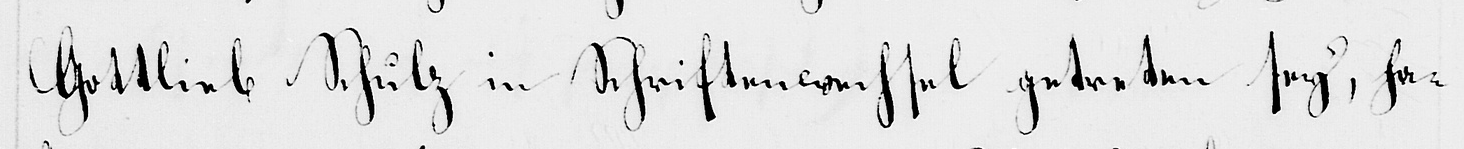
Gottlieb Schulz in Schriftenwechsel getreten sey, ha¬
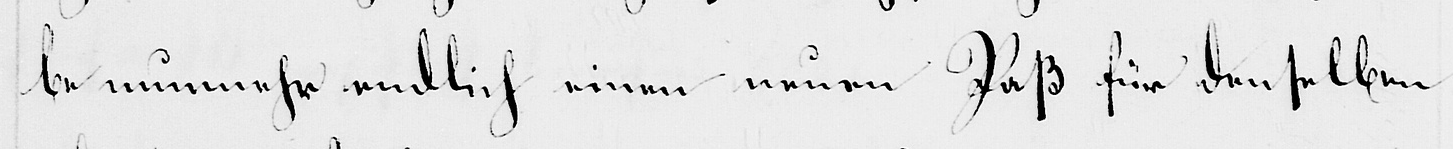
be nunmehr endlich einen neuen Paß für denselben
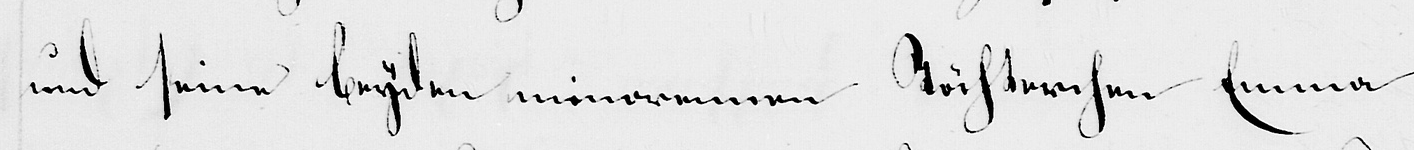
und seine beyden minorennen Töchterchen Emma
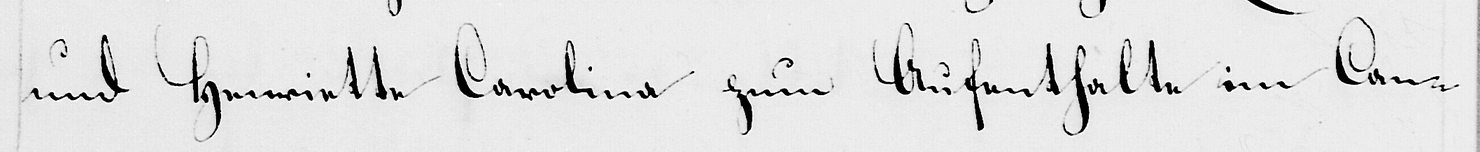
und Henrietta Carolina zum Aufenthalte im Can¬
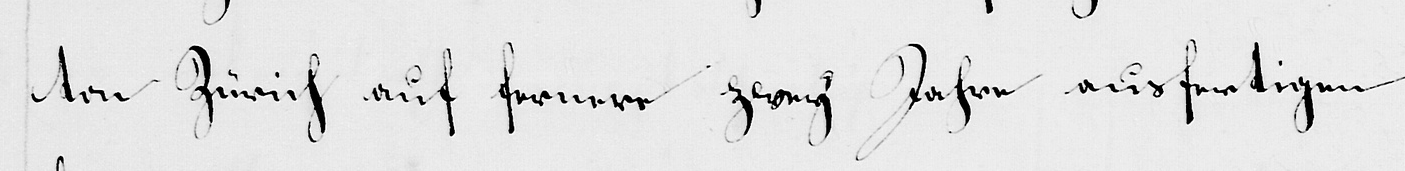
ton Zürich auf fernere zwey Jahre ausfertigen
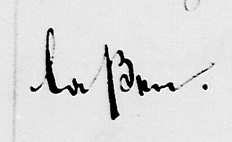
laßen.
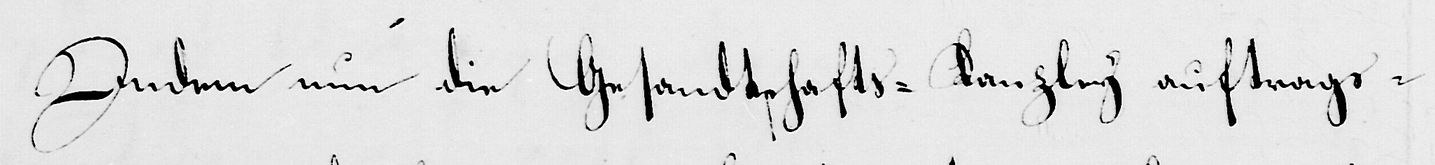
Indem nun die Gesandtschafts-Kanzley auftrags¬
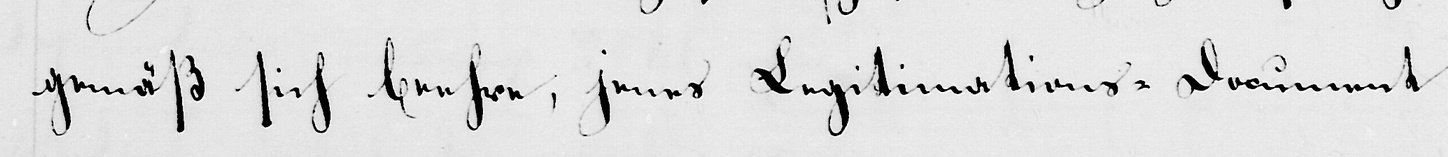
gemäß sich beehre, jenes Legitimations-Document
